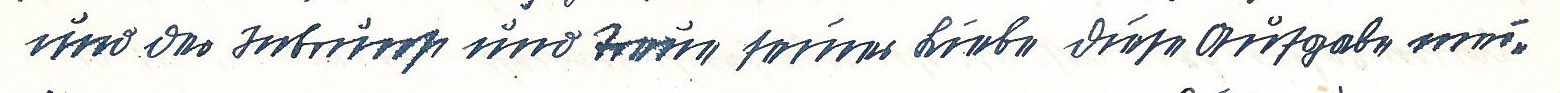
und Inbrunst und Treue seiner Liebe diese Aufgabe meis¬
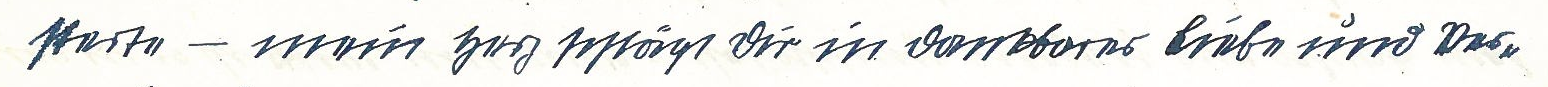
terte – mein Herz schlägt Dir in dankbarer Liebe und Ver¬
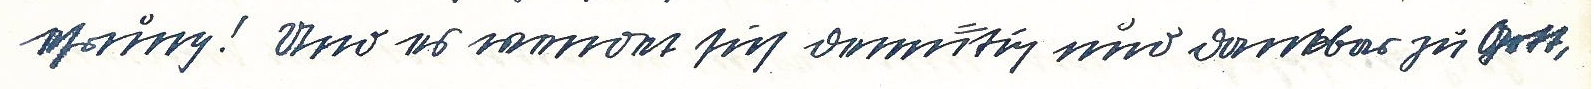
ehrung! Und es wendet sich demütig und dankbar zu Gott,
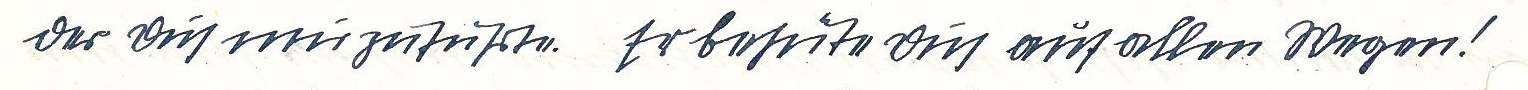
der Dich mir zuführte. Er behüte Dich auf allen Wegen!
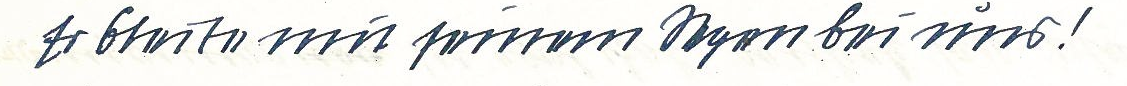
Er bleibe mit seinem Segen bei uns!
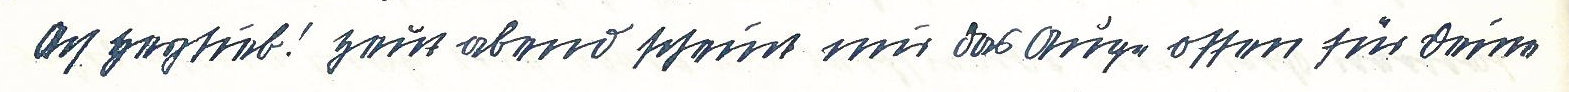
Ach Herzlieb! Heut abend scheint mir das Auge offen für Deine
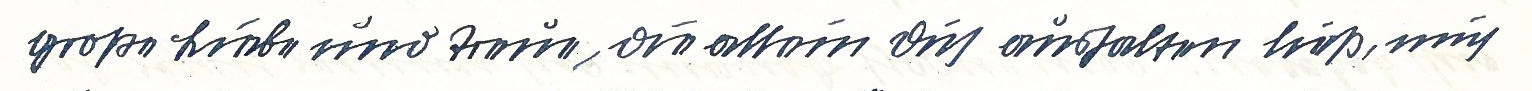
große Liebe und Treue, die allein Dich aushalten ließ, mich
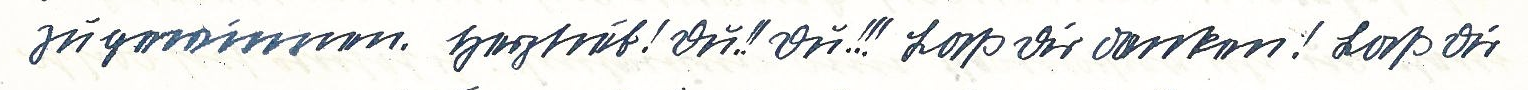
zu gewinnen. Herzlieb! Du!! Du!!! Laß Dir danken! Laß Dir
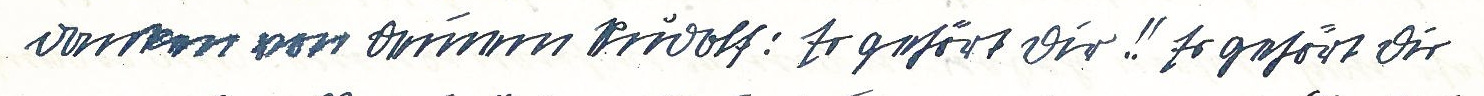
danken von Deinem Rudolf: Er gehört Dir!! Er gehört Dir
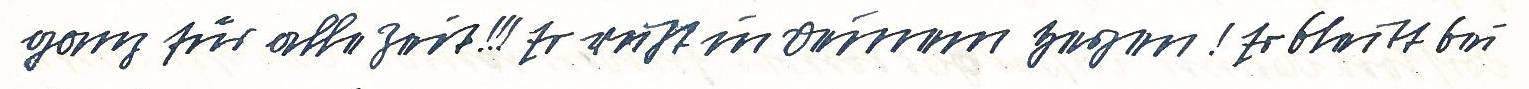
ganz für alle Zeit!!! Er ruht in Deinem Herzen! Er bleibt bei
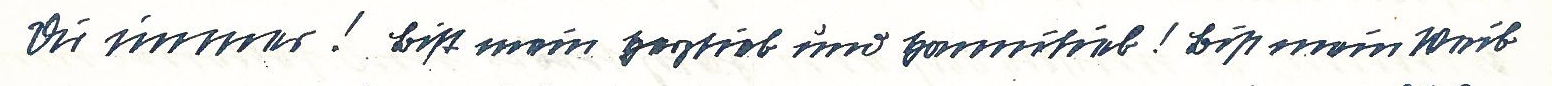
Dir immer! Bist mein Herzlieb und lieb! Bist mein Weib
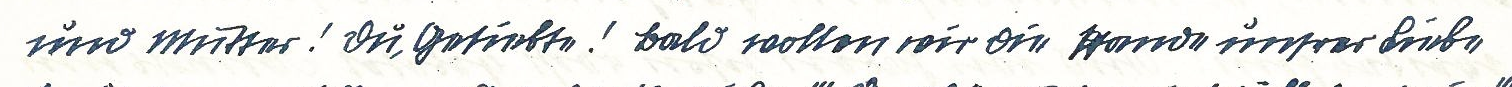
und Mutter! Du, Geliebte! Bald wollen wir die Pfande unsrer Liebe
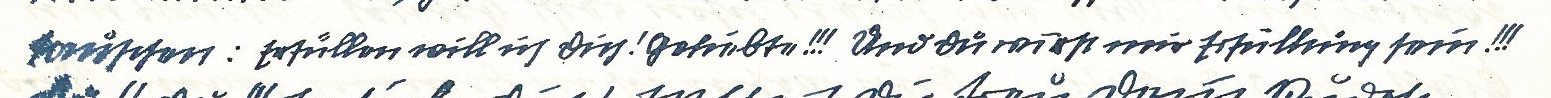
tauschen: Erfüllen will ich Dich! Geliebte!!! Und Du wirst mir Erfüllung sein!!!
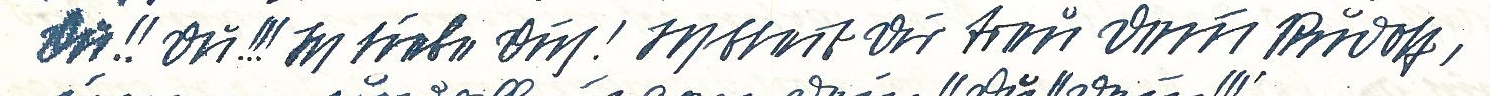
Du!! Du!!! Ich liebe Dich! Ich bleib Dir treu Dein Rudolf,
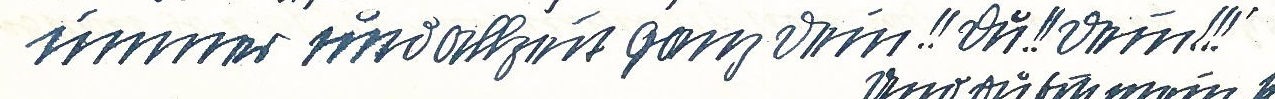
immer und allzeit ganz Dein!! Du!! Dein!!!`
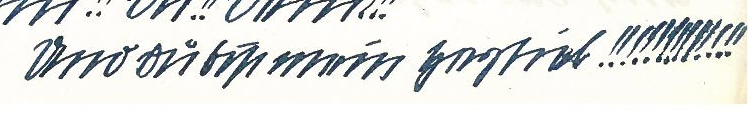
Und Du bist mein Herzlieb!!!!!!!!!!!!!
